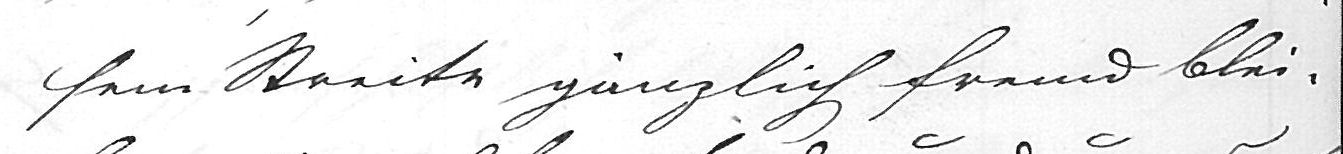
sem Streite gänzlich fremd blei-
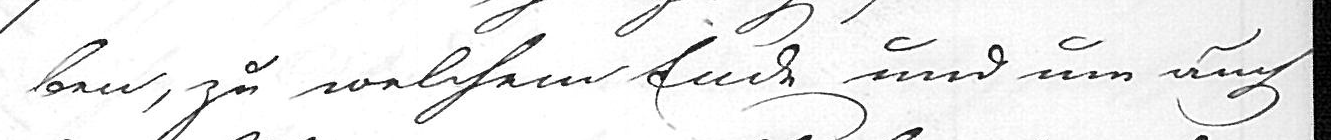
ben, zu welchem Ende und um auch
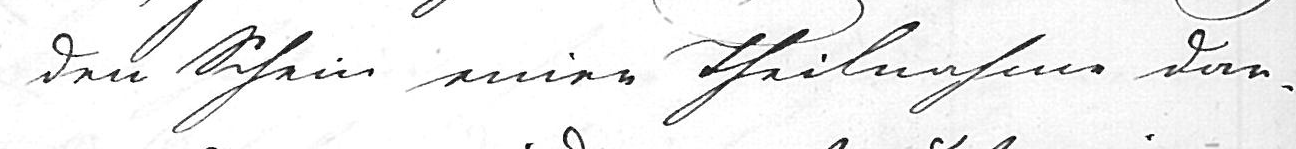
den Schein einer Theilnahme dar-
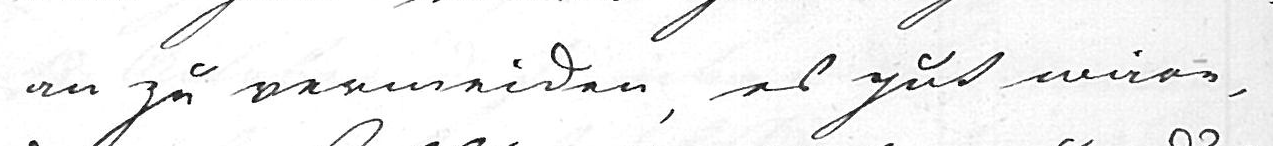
an zu vermeiden, es gut wäre,
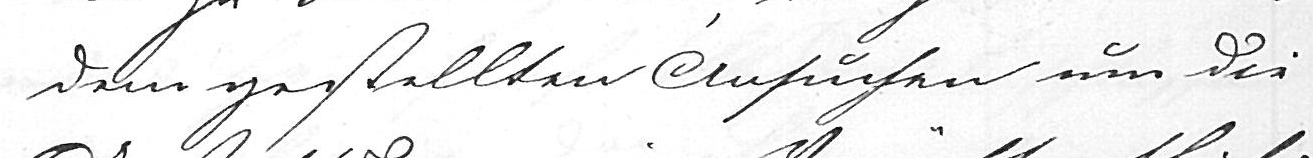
dem gestellten Ansuchen um die
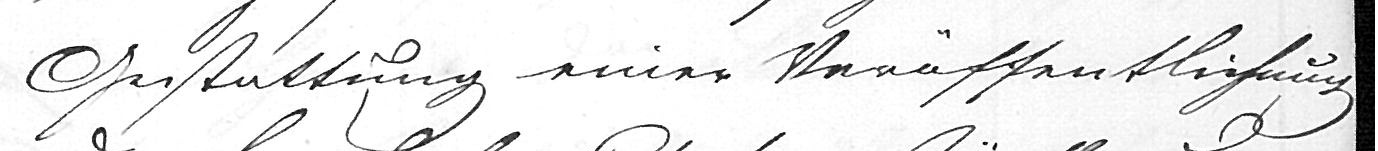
Gestättung einer Veröffentlichung
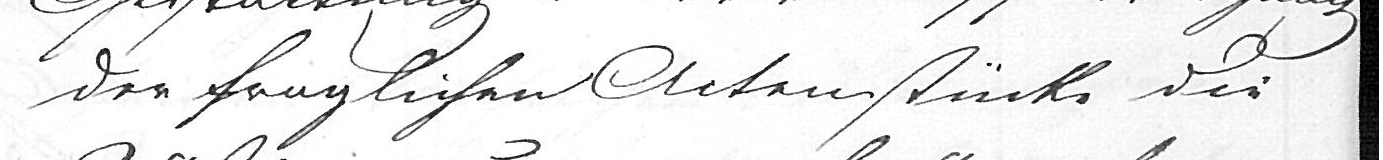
der fraglichen Actenstücke die
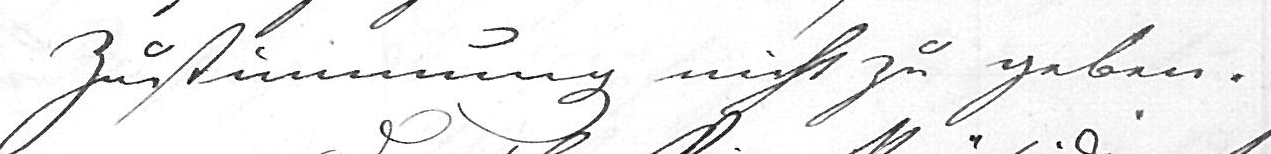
Zustimmung nicht zu geben.
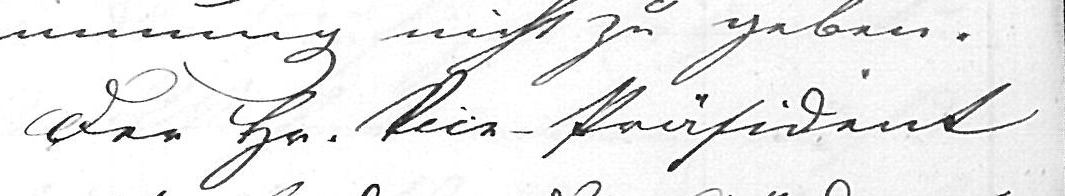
Der Hr. Vice-Präsident
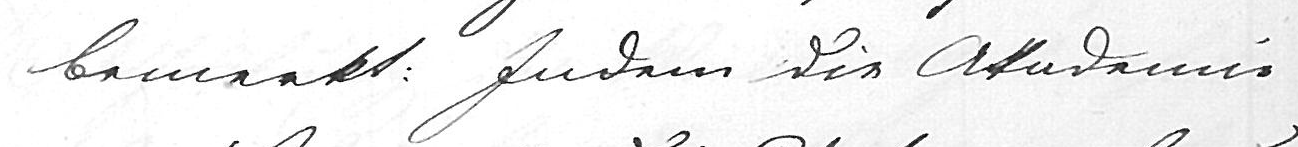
bemerkt: Indem die Akademie
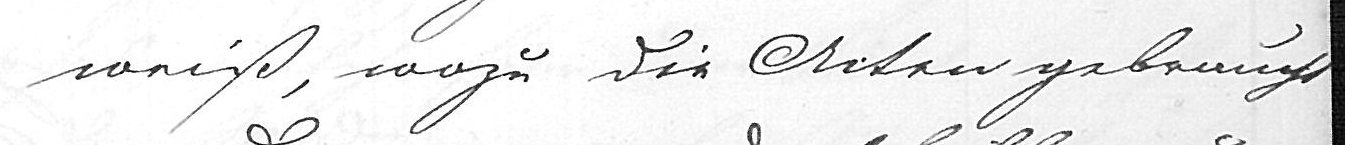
weiß, wozu die Acten gebraucht
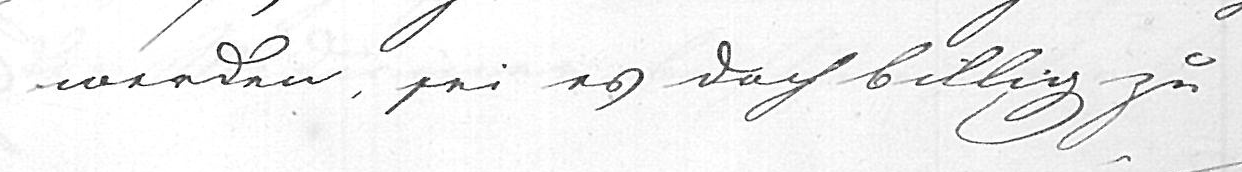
werden, sei es doch billig zu
